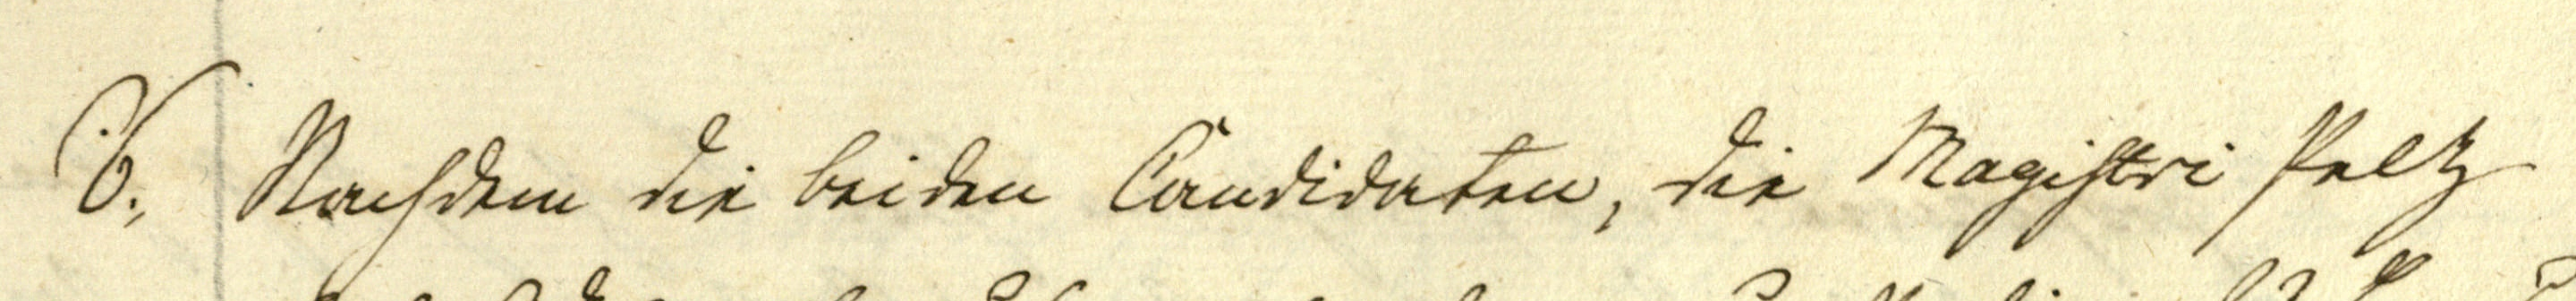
6. Nachdem die beiden Candidaten, die Magistri Pelz
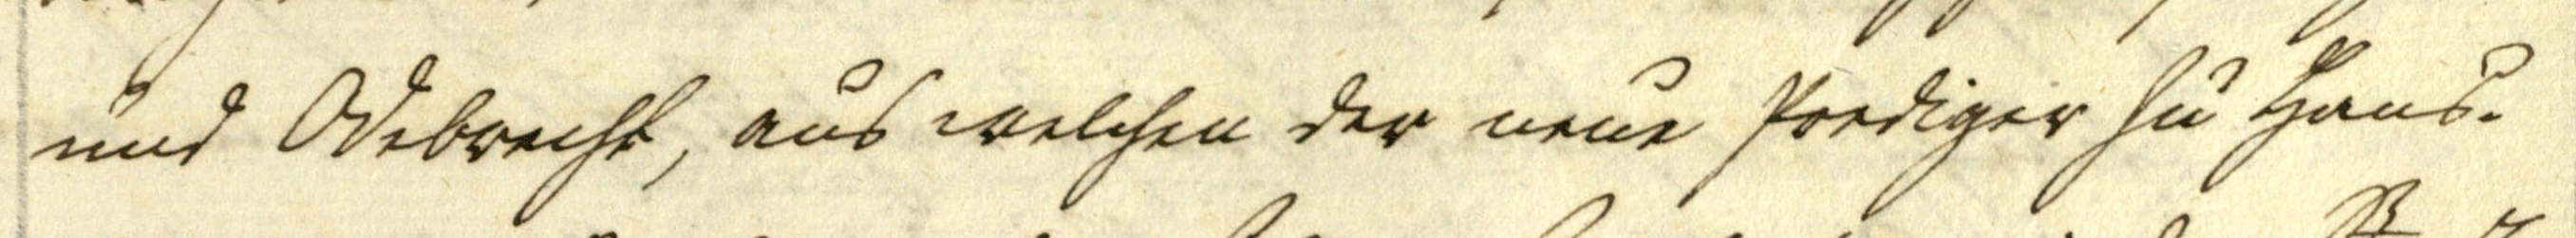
und Odebrecht, aus welchen der neue Prediger zu Hans¬
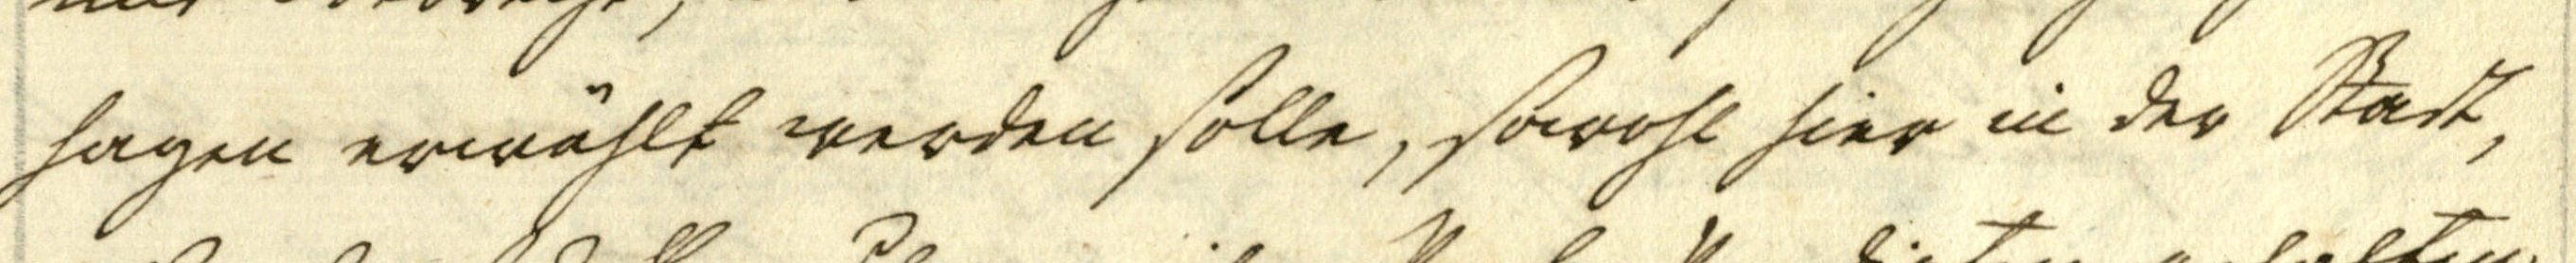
hagen erwählt werden solle, sowohl hier in der Stadt,
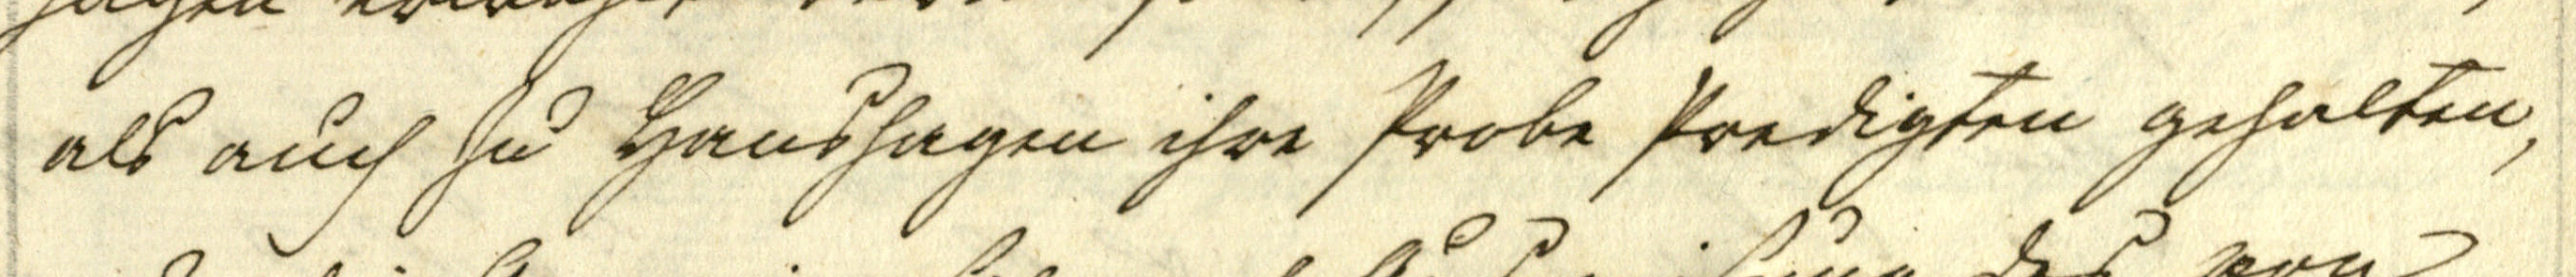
als auch zu Hanshagen ihre Probe Predigten gehalten,
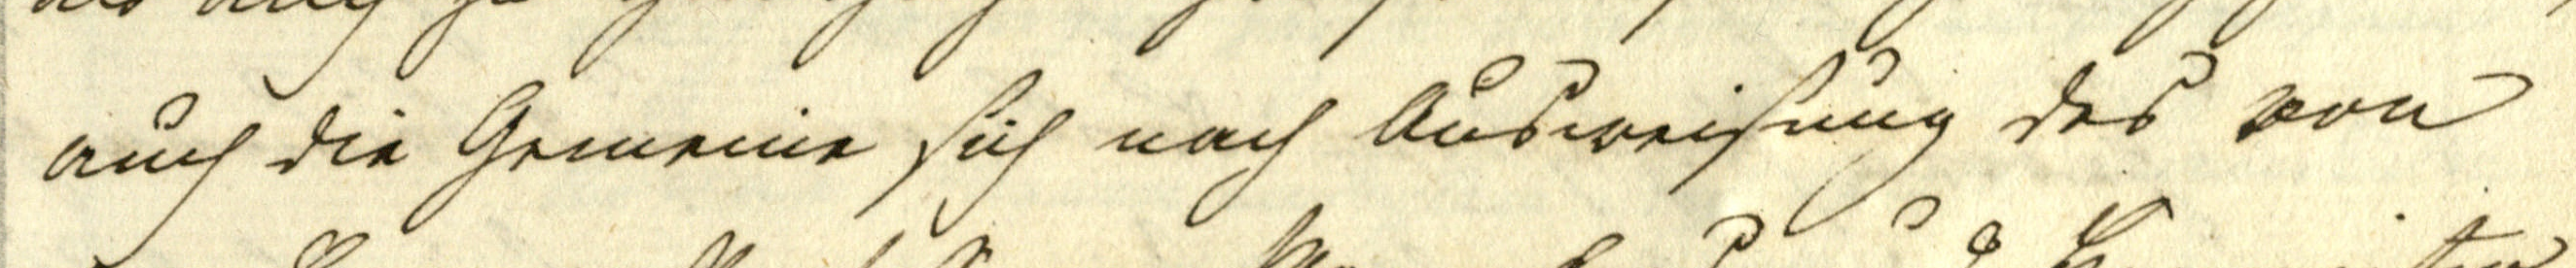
auch die Gemeine sich nach Ausweisung des von
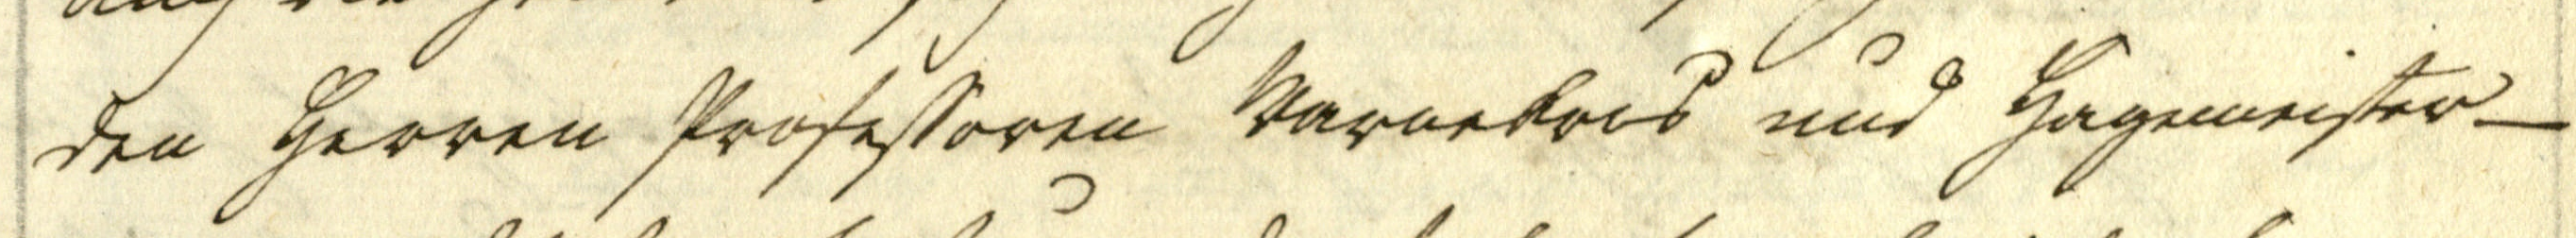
den Herren Professoren Warnekros und Hagemeister -
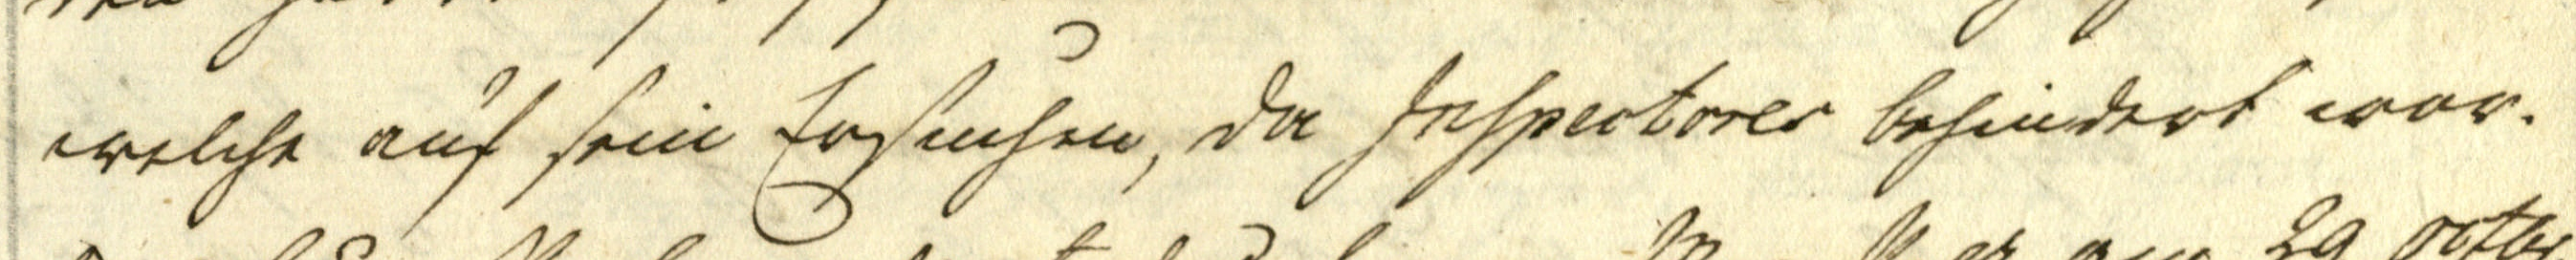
welche auf sein Ersuchen, da Inspectores behindert wor¬
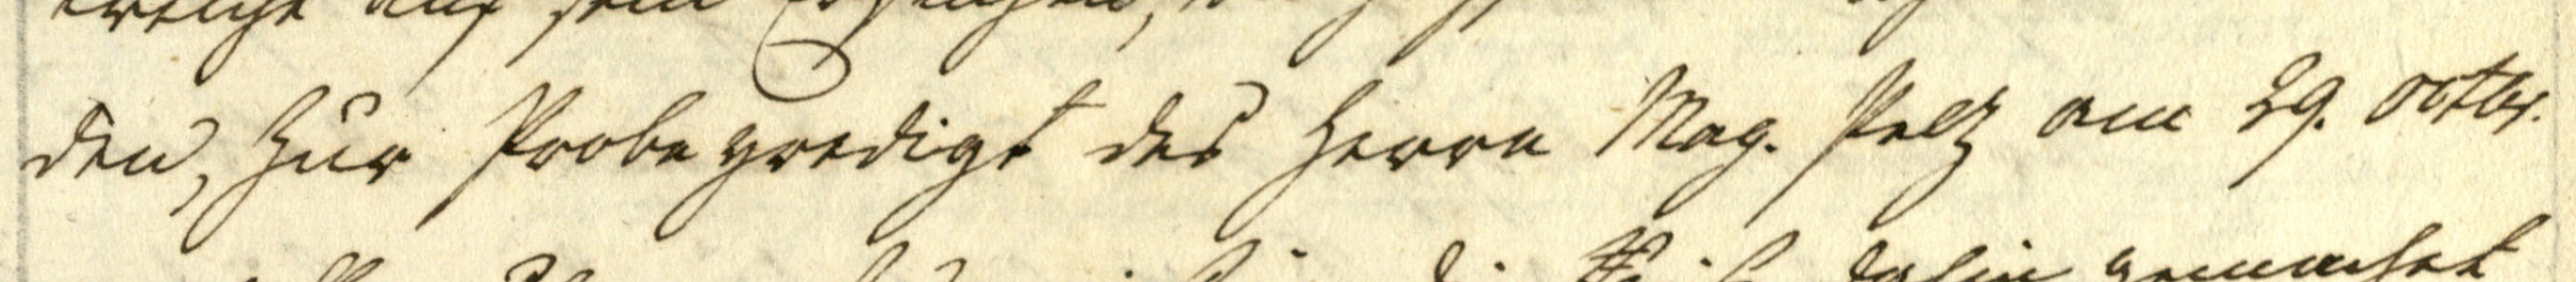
den, zur Probe predigt des Herrn Mag. Pelz am 29. Octbr.
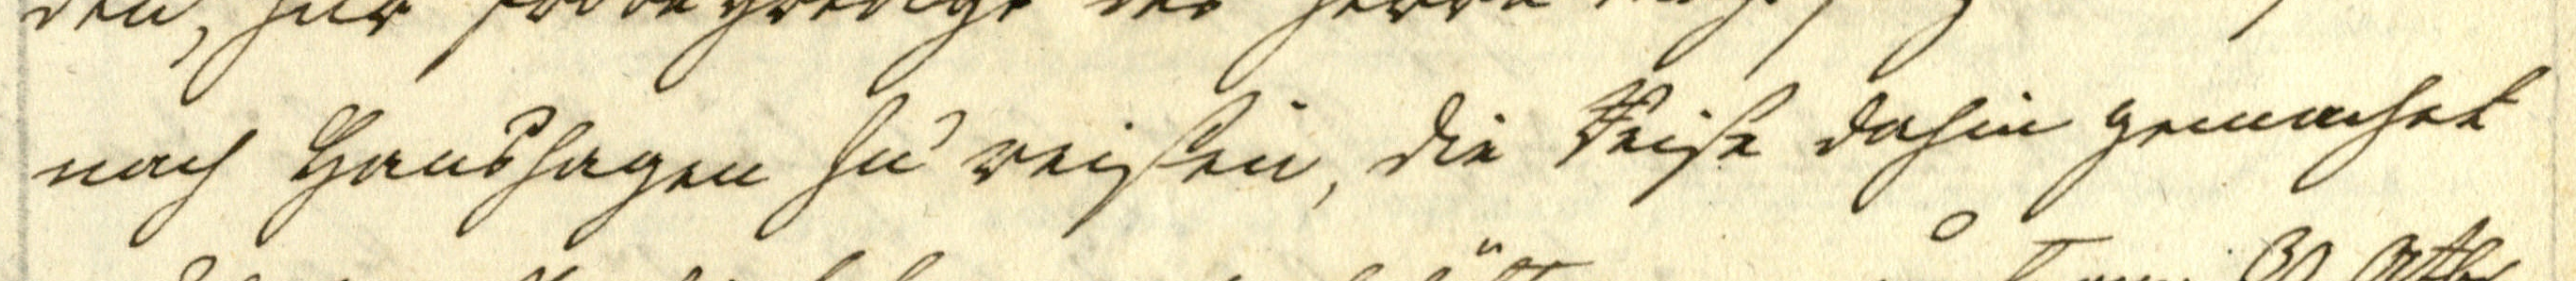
nach Hanshagen zu reisen, die Reise dahin gemachet
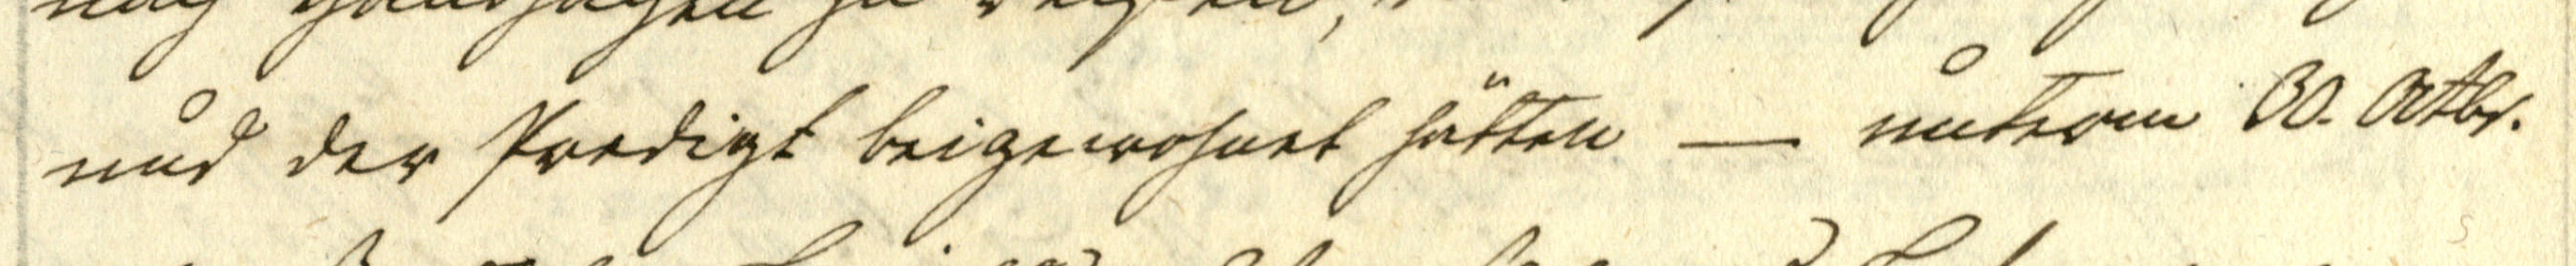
und der Predigt beigewohnet hätten - unterm 30 Octbr.
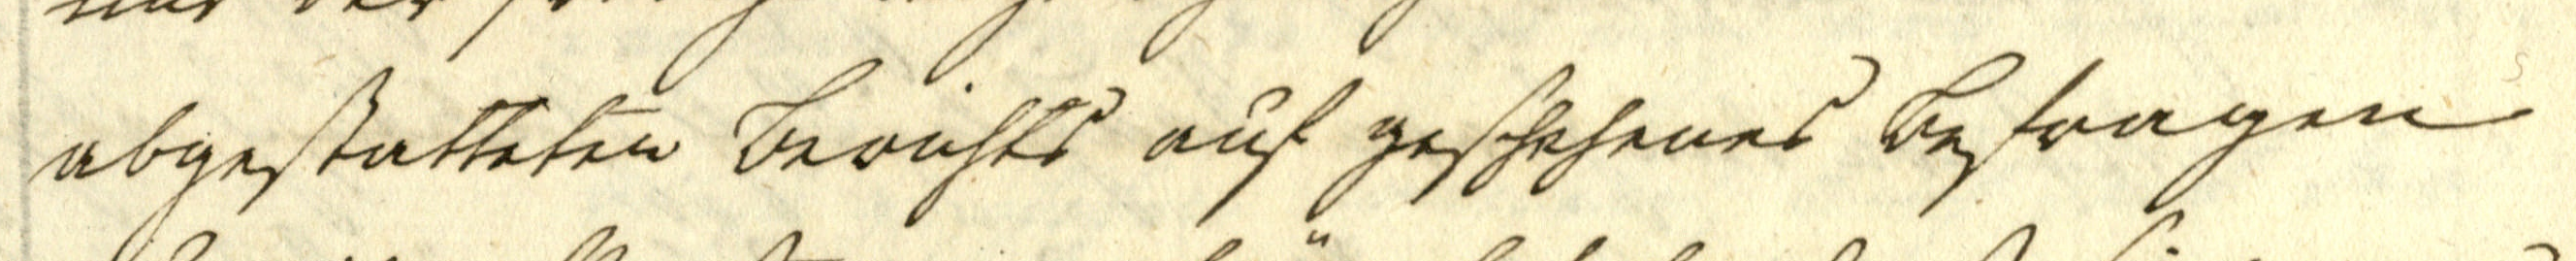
abgestatteten Berichts auf geschehenes Befragen
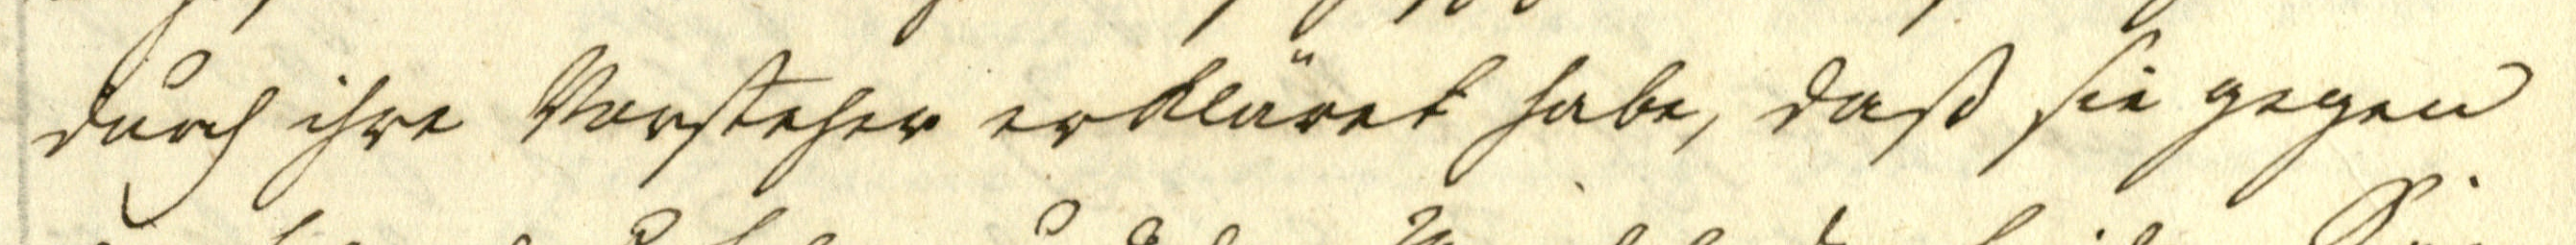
durch ihre Vorsteher erkläret habe, daß sie gegen
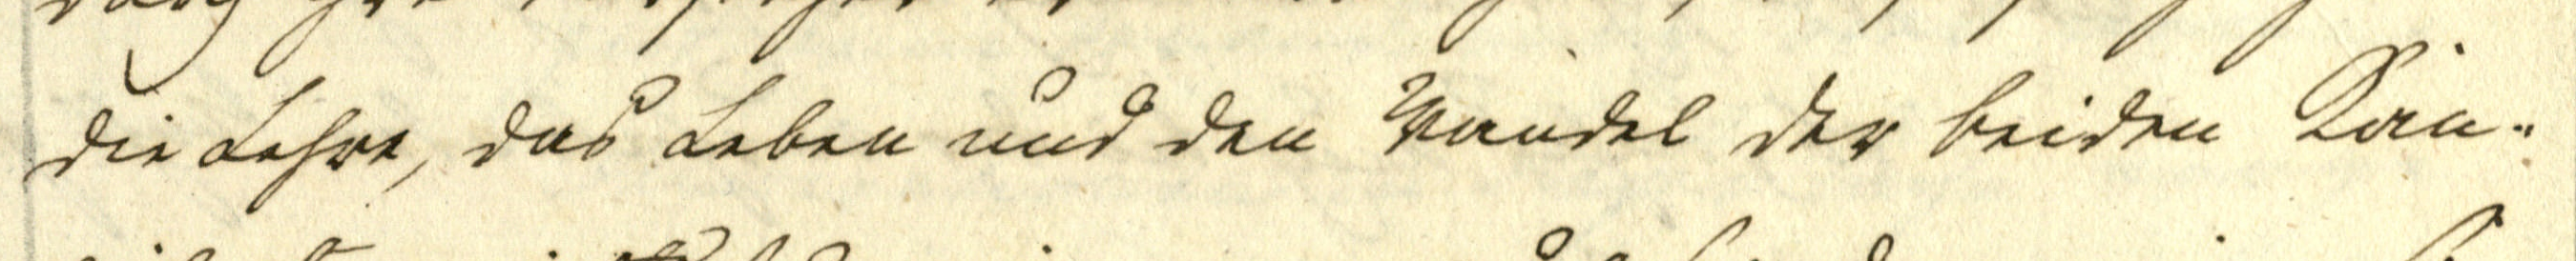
die Lehre, das Leben und den Wandel der beiden Kan¬
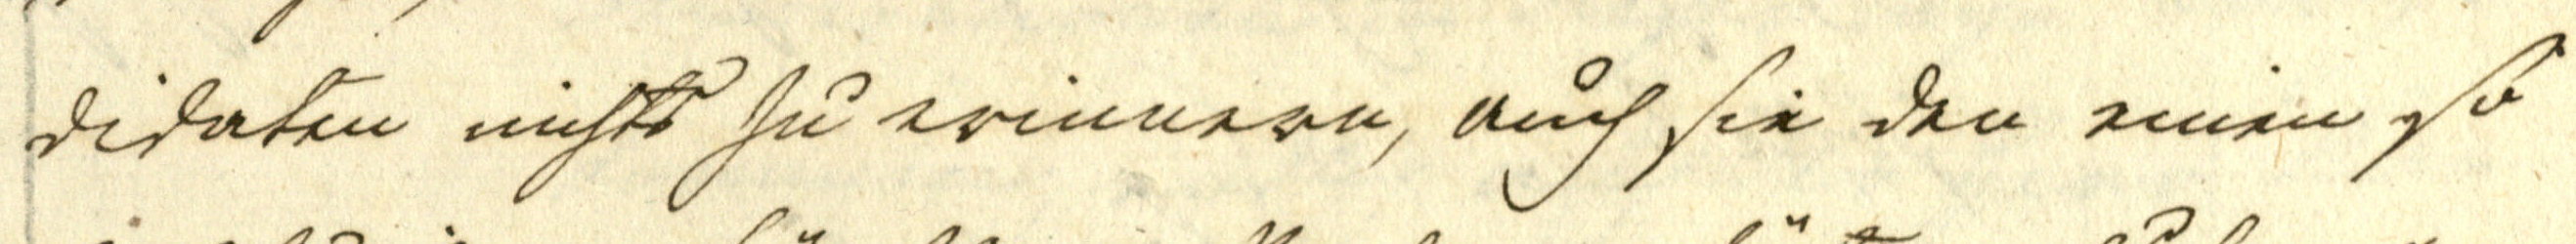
didaten nichts zu erinnern, auch sie den einen so
